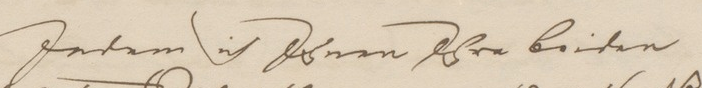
Indem ich Ihnen Ihre beiden
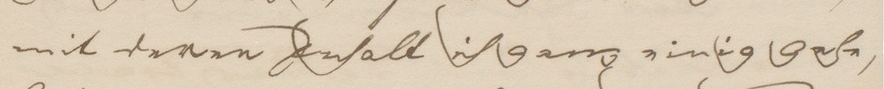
mit deren Inhalt ich ganz einig gehe,
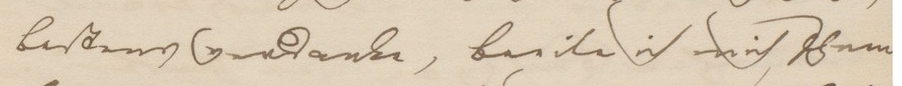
bestens verdanke, beeile ich mich, Ihnen
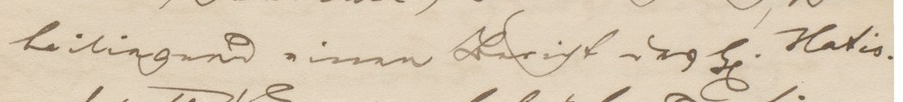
beiliegend einen Bericht des H. Natio-
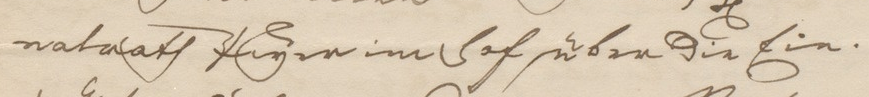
nalrath Peyer im Hof über die Ein-
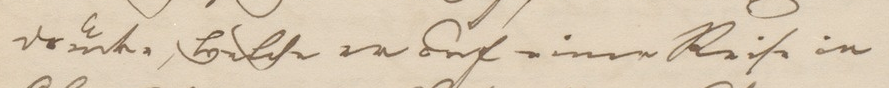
drücke, welche er auf einer Reise in
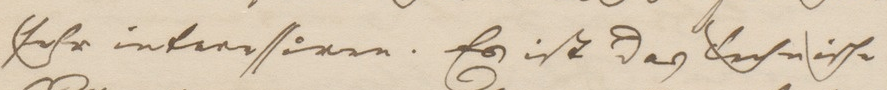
sehr interessiren. Es ist das technische
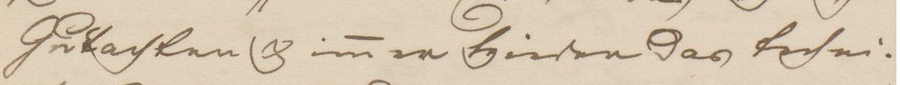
Gutachten & immer wieder das techni-
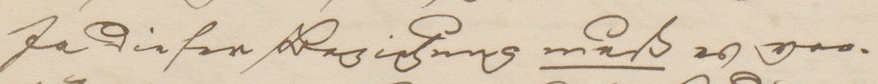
In dieser Beziehung muß es vor-
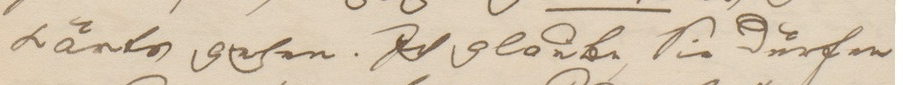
wärts gehen. Ich glaube, Sie dürfen
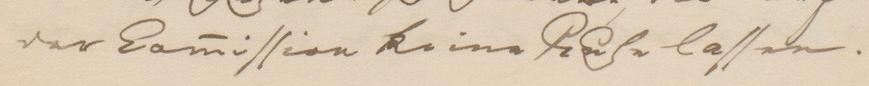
der Commission keine Ruhe lassen.
